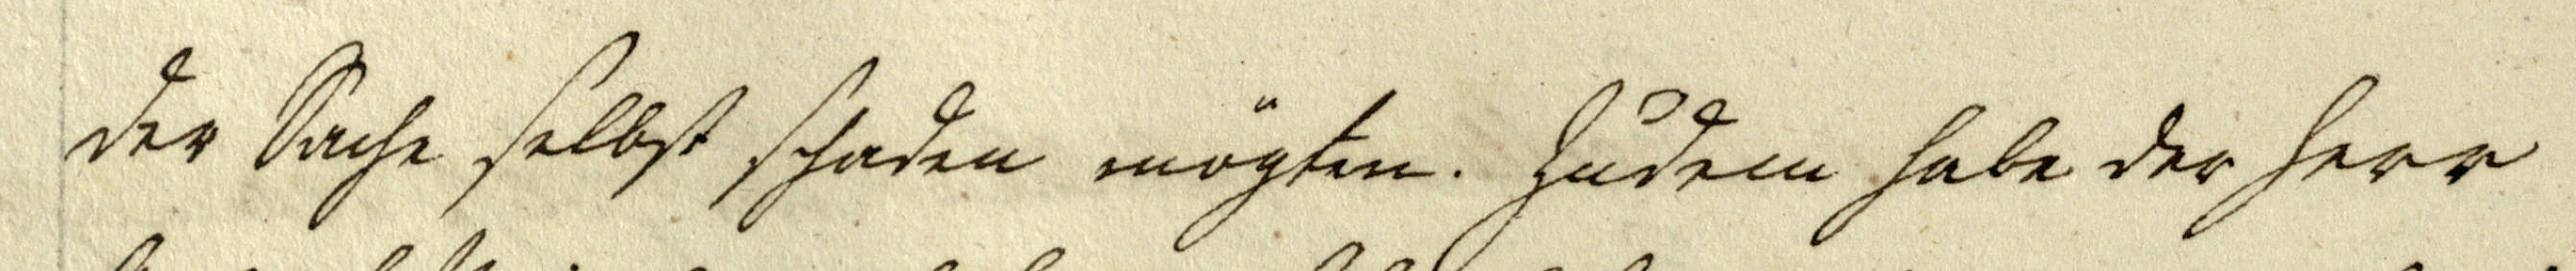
der Sache selbst Schaden mögten. Zudem habe der Herr
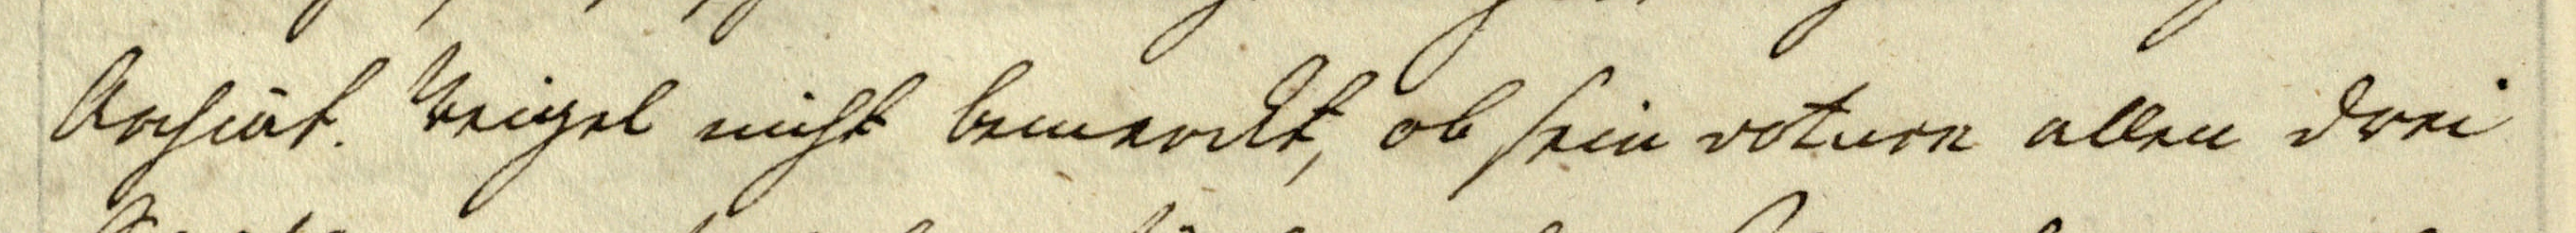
Archiat. Weigel nicht bemerckt, ob sein votum allen drei
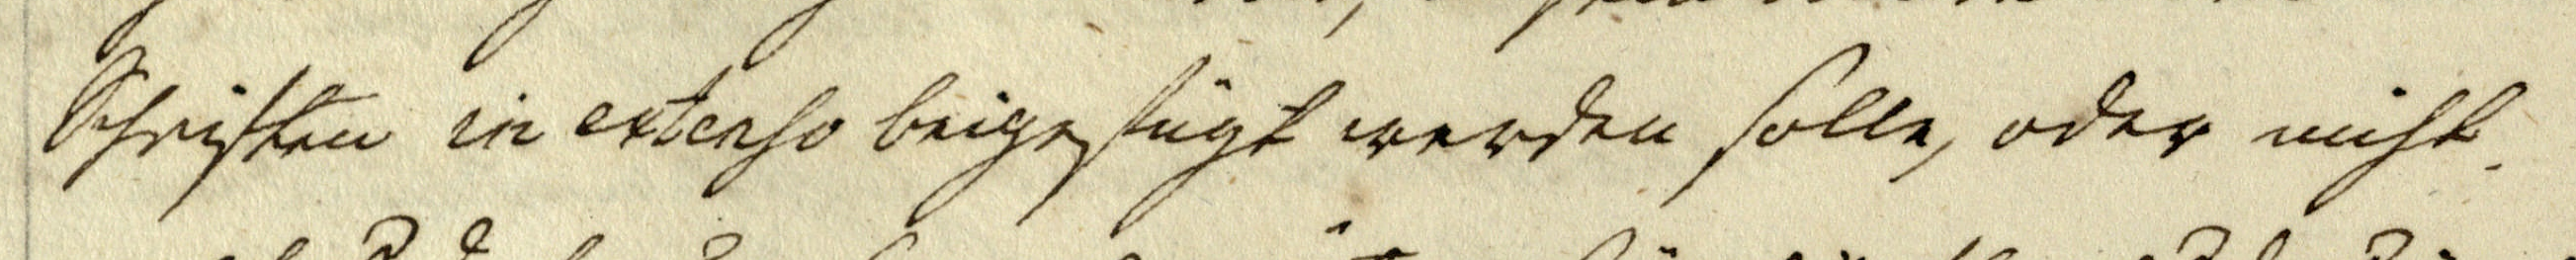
Schriften in extenso beigefügt werden solle, oder nicht,
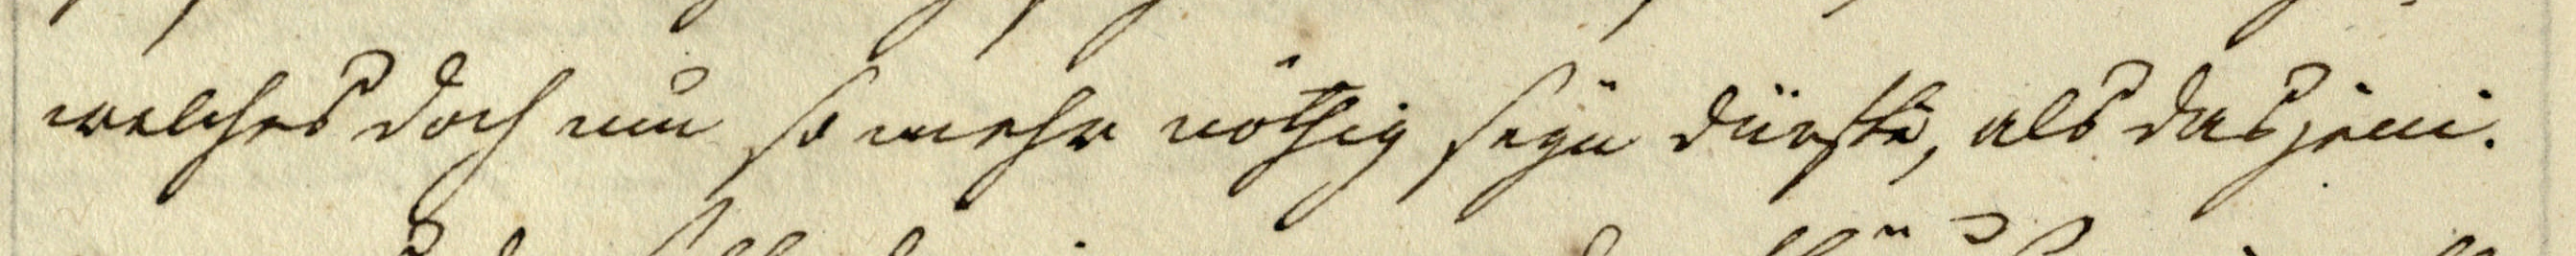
welches doch um so mehr nöthig seÿn dürfte, als dasjeni¬
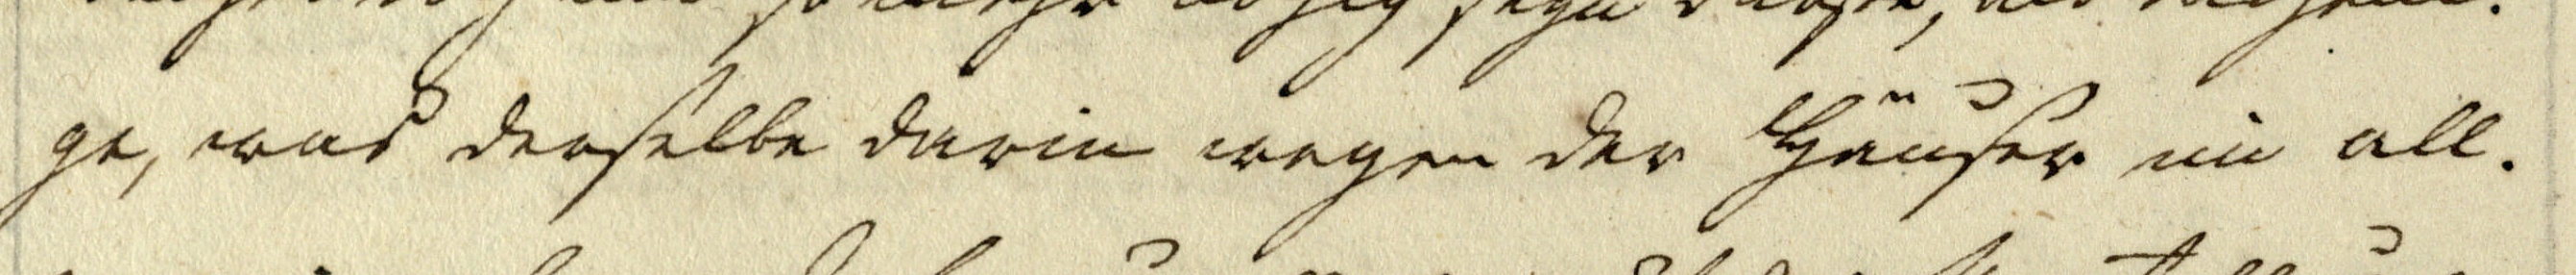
ge, was derselbe darin wegen der Häuser im all¬
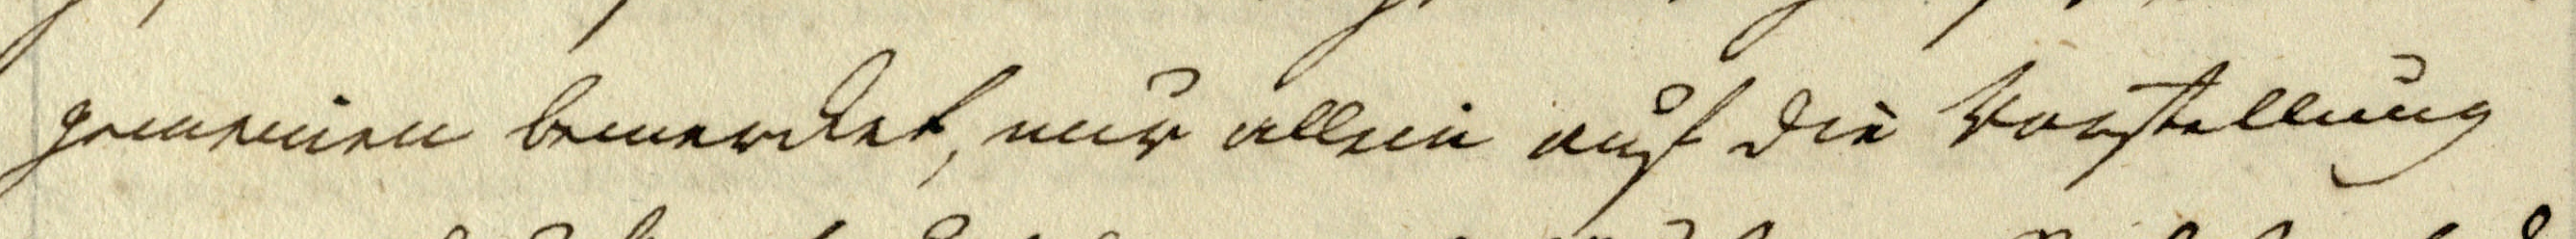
gemeinen bemercket, nur allein auf die Vorstellung
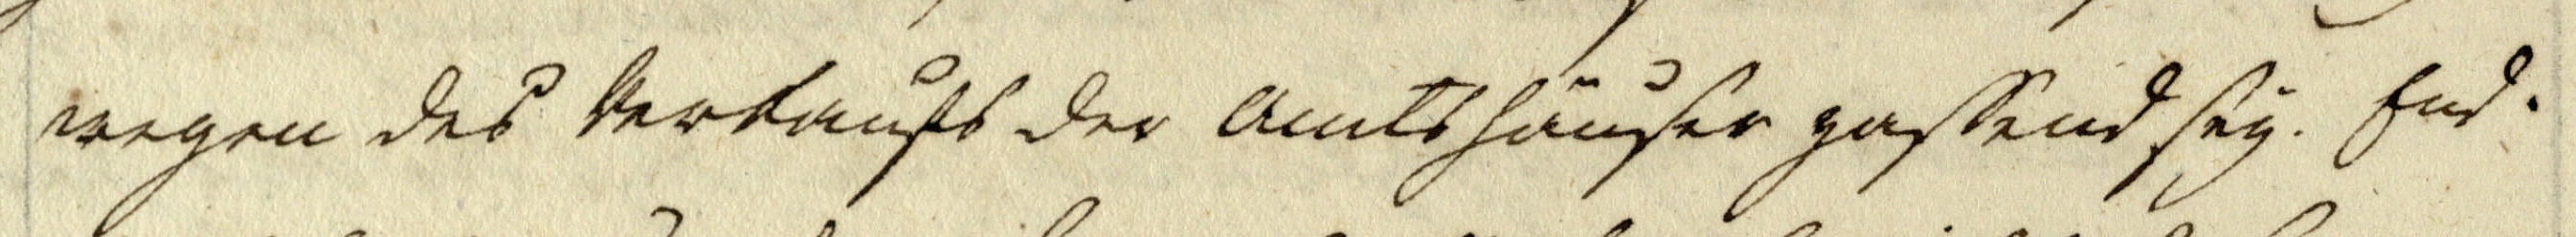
wegen des Verkaufs der Amtshäuser passend seÿ. End¬
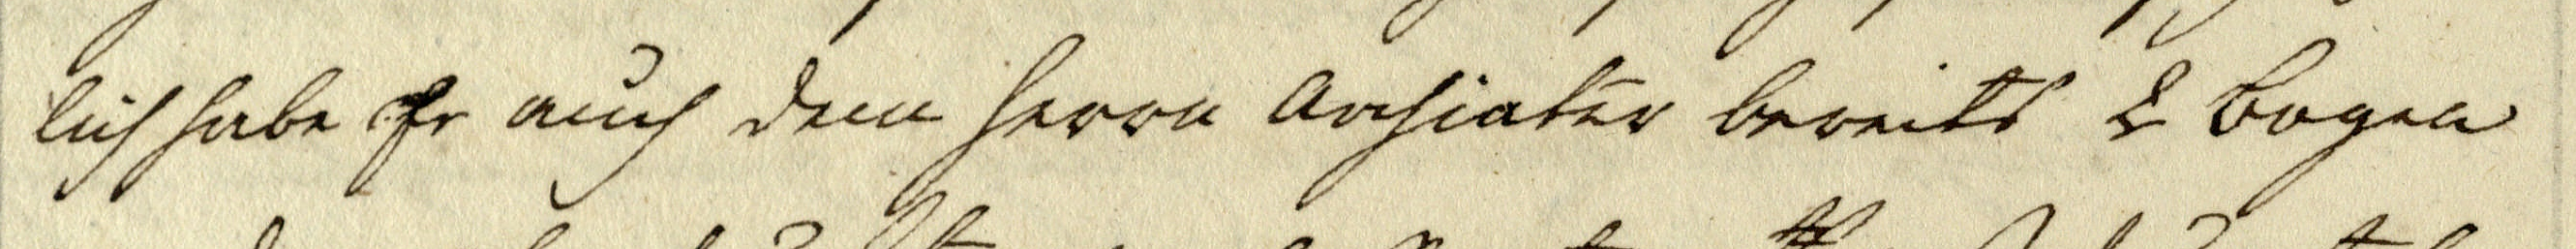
lich habe Er auch dem Herrn Archiater bereits 2 Bogen
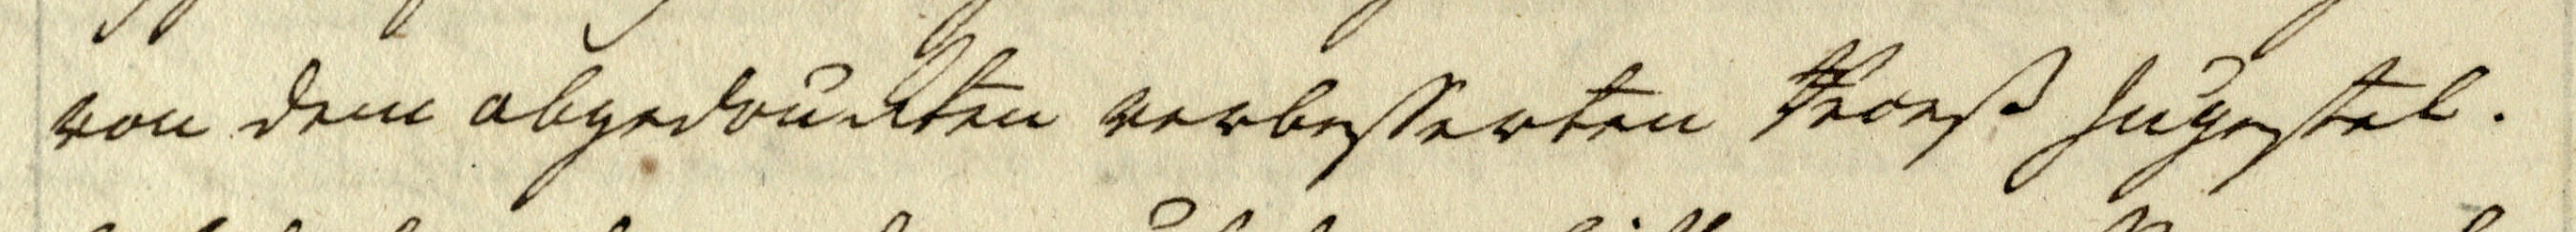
von dem abgedruckten verbesserten Receß zugestel¬
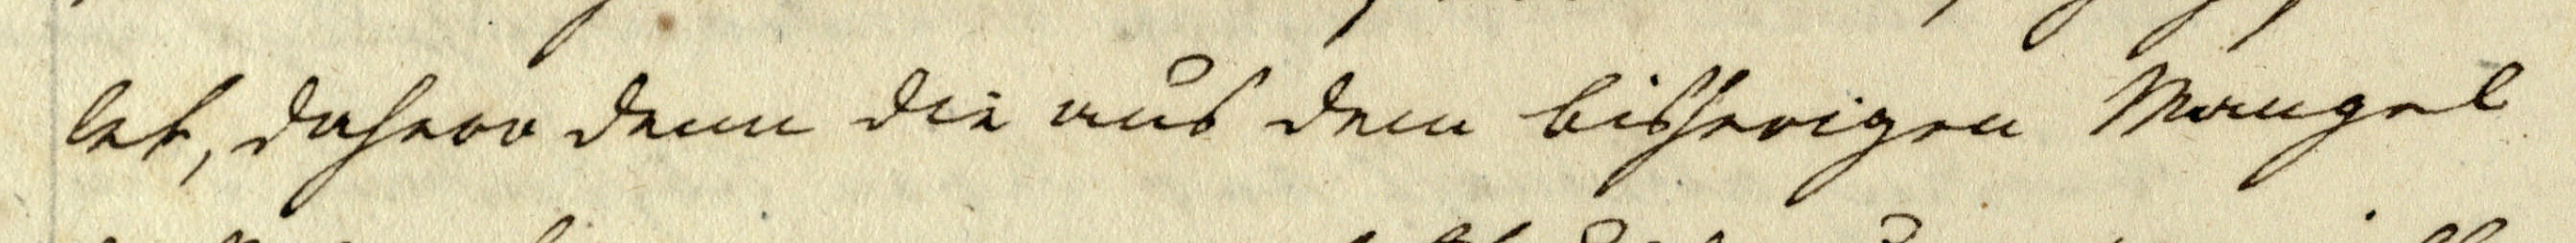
let, dahero denn die aus dem bisherigen Mangel
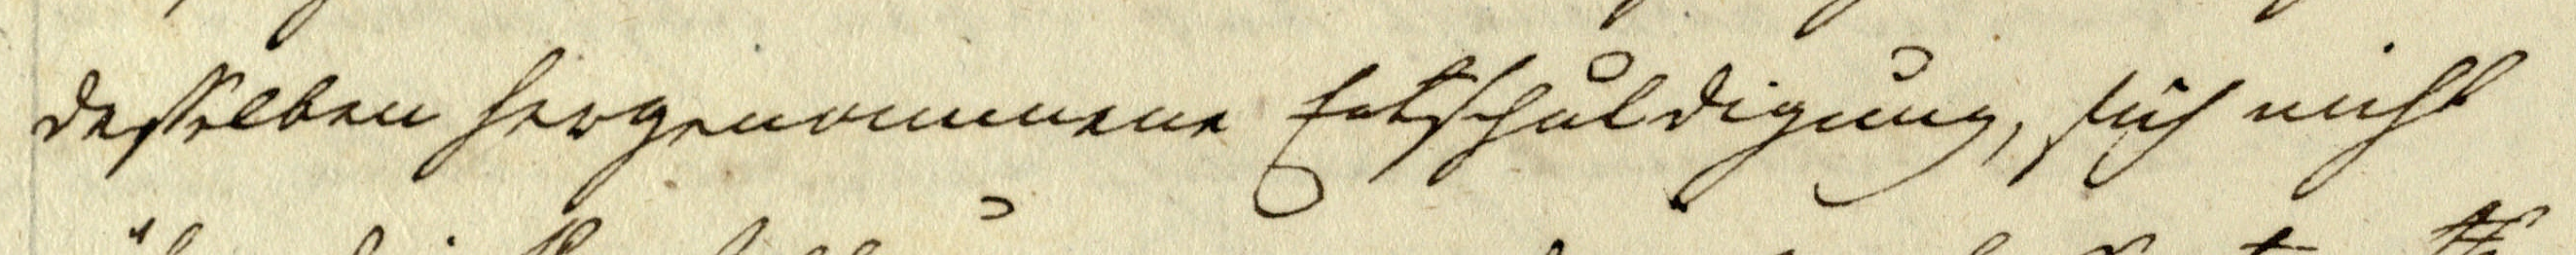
desselben hergenommene Entschuldigung, sich nicht
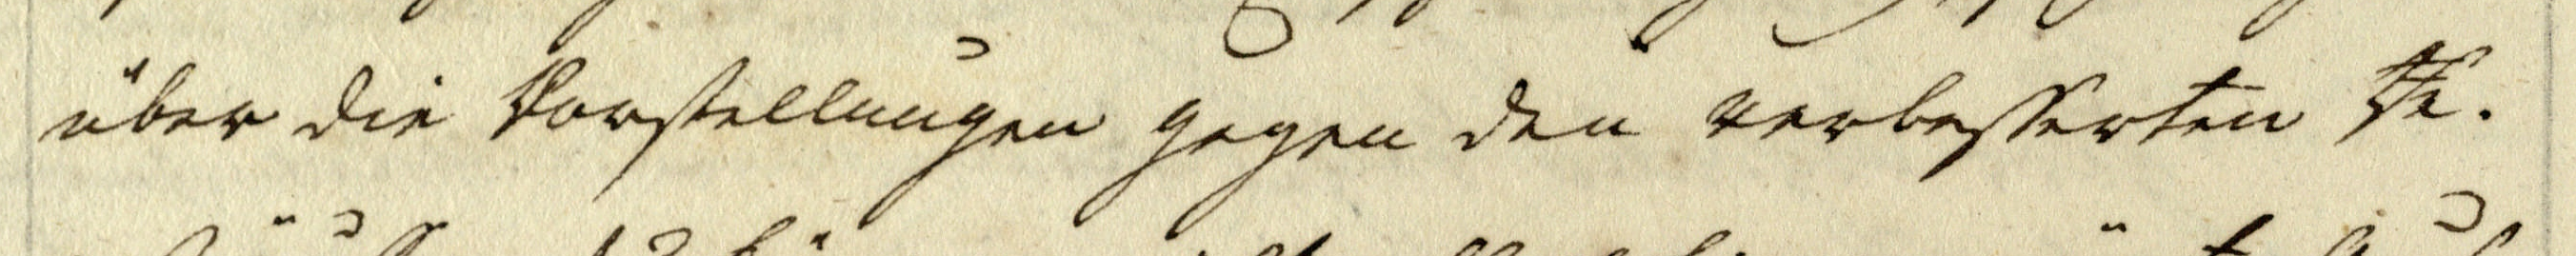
über die Vorstellungen gegen den verbesserten Re¬
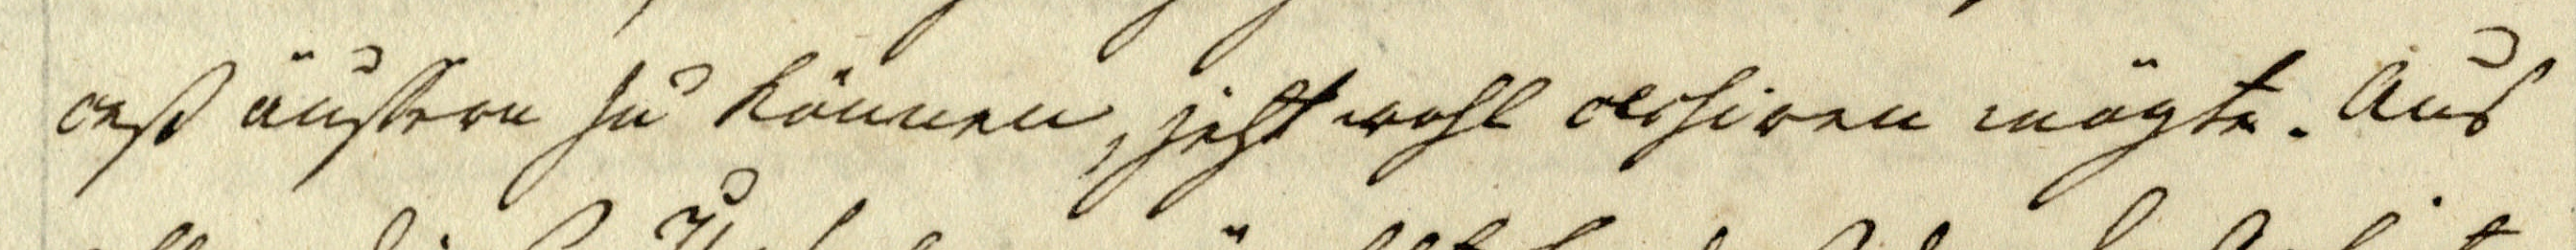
ceß äussern zu können, jetzt wohl cessiren mögte. Aus
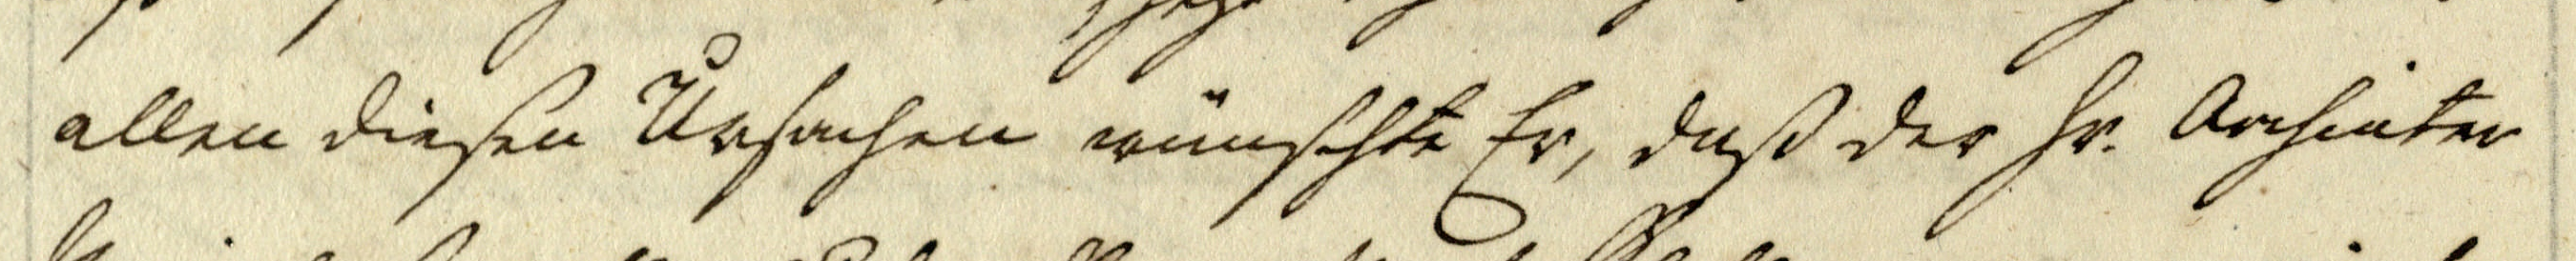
allen diesen Ursachen wünschte Er, daß der Hr. Archiater
